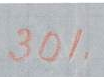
Jan.
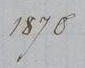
1870
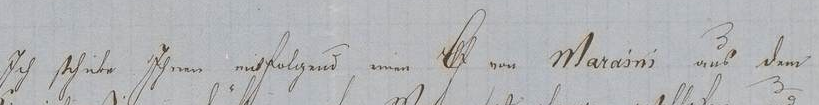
Ich schicke Ihnen mitfolgend einen Bf von Maraini aus dem
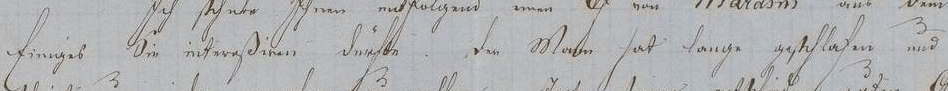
Einiges Sie intereßiren dürfte. Der Mann hat lange geschlafen und
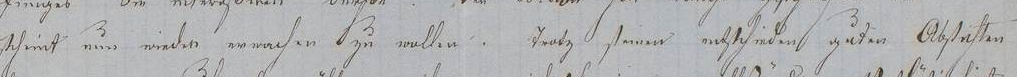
scheint nun wieder erwachen zu wollen. Trotz seinen entschieden guten Absichten
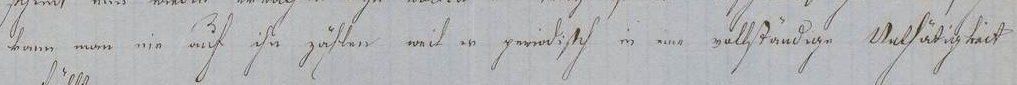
kann man nie auf ihn zählen weil er periodisch in eine vollständige Unthätigkeit
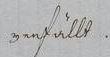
verfällt.
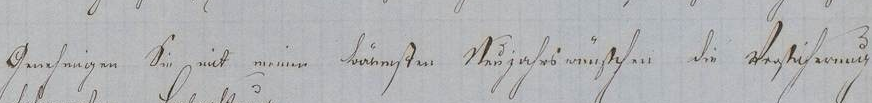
Genehmigen sie mit meinen wärmsten Neujahrswünschen die Versicherung
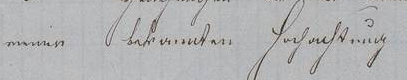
meiner bekannten Hochachtung
